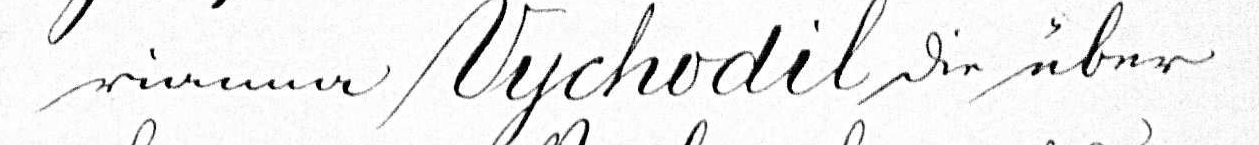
rianna Vychodil die über
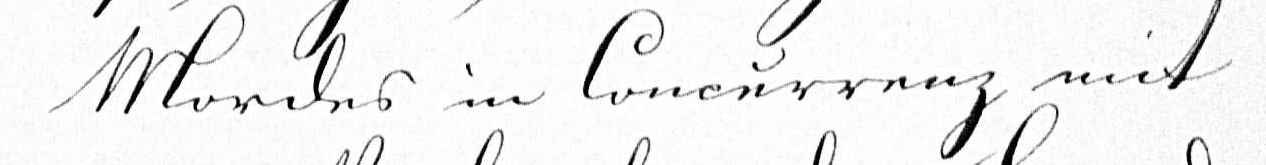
Mordes in Concurrenz mit
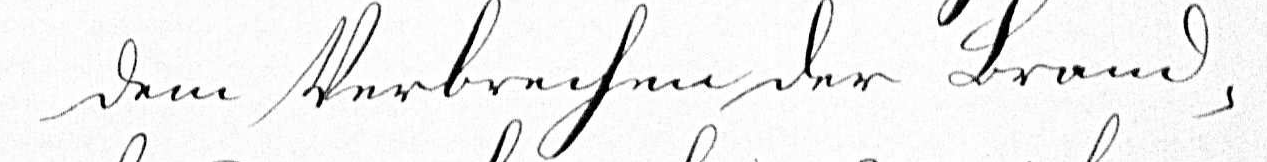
dem Verbrechen der Brand¬
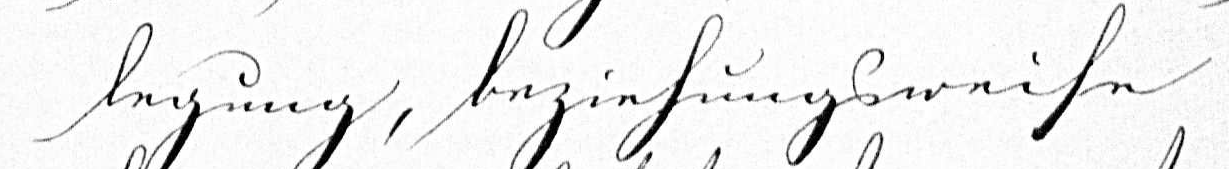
legung, beziehungsweise
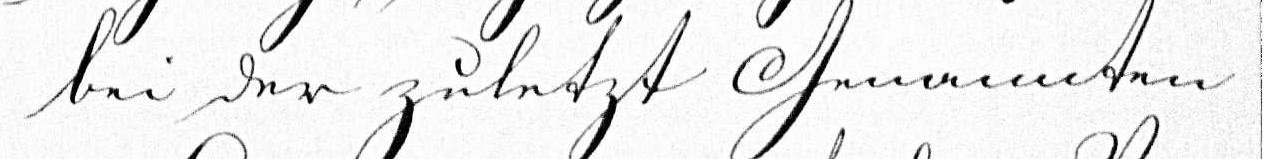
bei der zuletzt Genannten
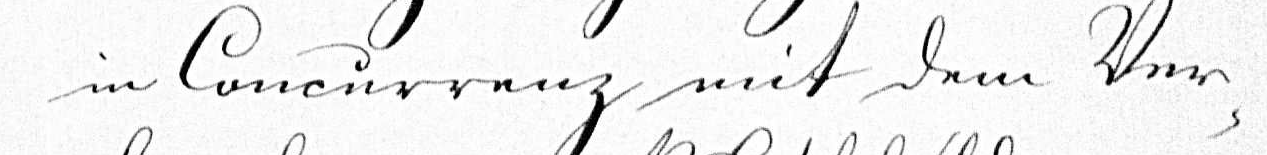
in Concurrenz mit dem Ver¬
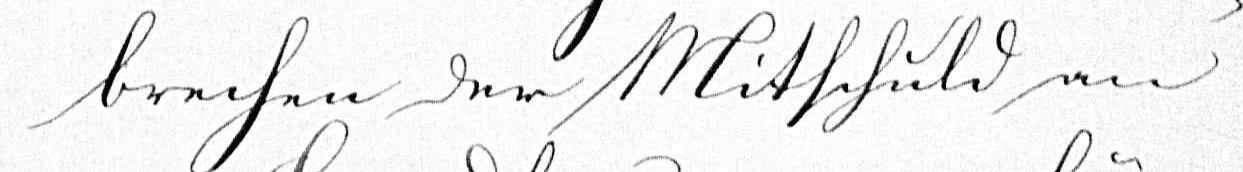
brechen der Mitschuld an
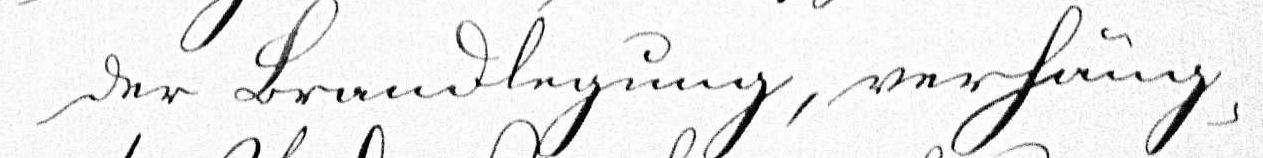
der Brandlegung, verhäng¬
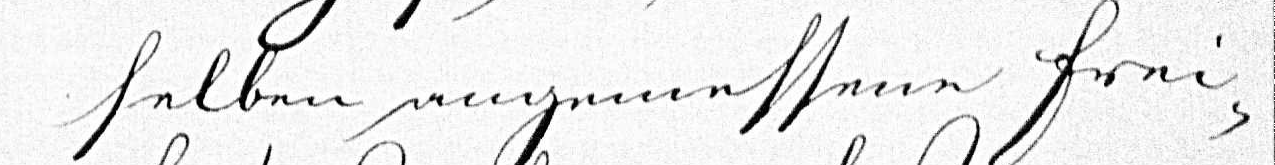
selben angemessene Frei¬
